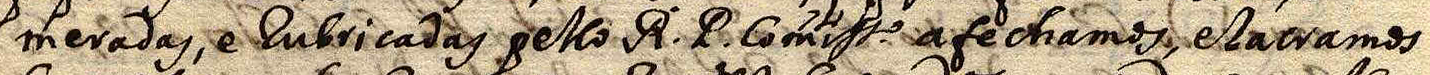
meradas, e Rubricadas pello R. P. Com̄iss.o a fechamos, e lacramos
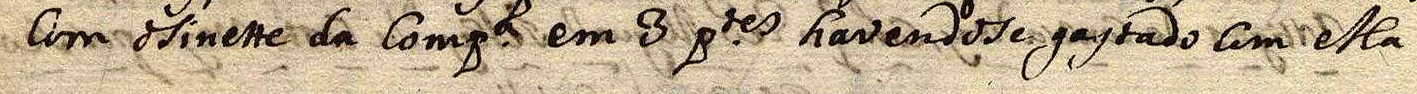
com o sinette da Comp.a em 3 p.tes havendose gastado com ella
